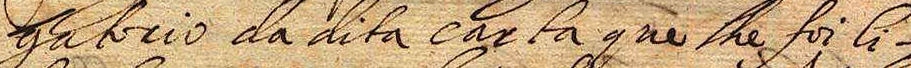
gatorio da dita carta que lhe foi li
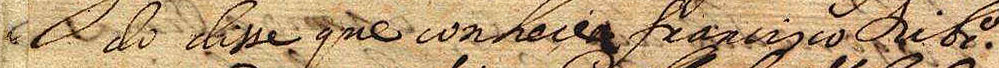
do disse que conheçia francisco Ribr.o
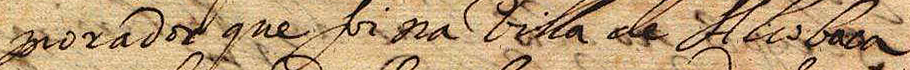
morador que foi na Villa de Alcobaca
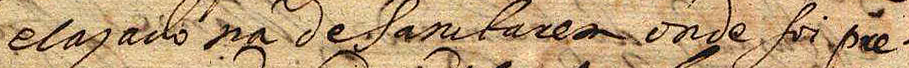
e cazado na de samtarem onde foi pre
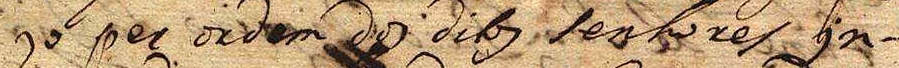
zo per ordem dos ditos senhores jn
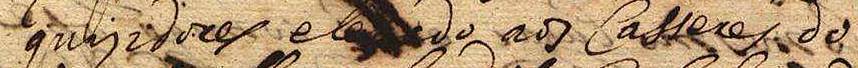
quizidores e le__do aos Casseres do
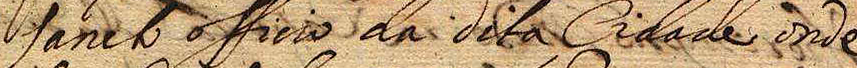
sancto officio da dita Cidade onde
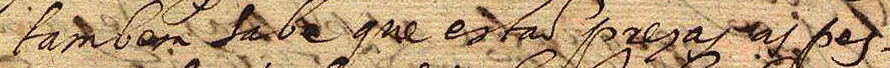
tambem sabe que estaõ prezas as pes
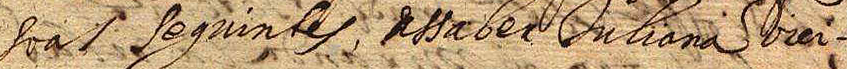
soas seguintes, a ssaber Iuliana Viei
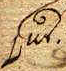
jur.
